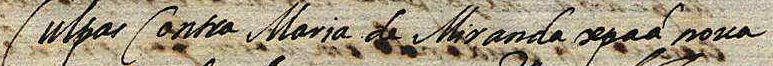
Culpas Contra Maria de Miranda xpaã noua
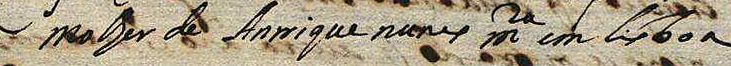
molher de Anrrique nunes mra em lisboa
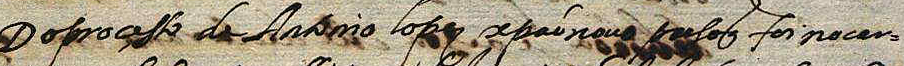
Do proçesso de Antonio lopez xpaõ nouo preso q̄ foi no car
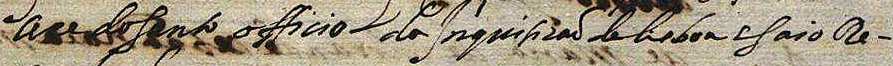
cere do santo officio da Jnquisicaõ de lisboa e saio Re
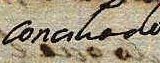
conciliado
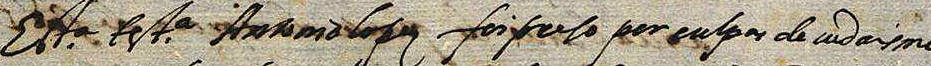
Est.a test.a Antonio lopez foi preso por culpas de iudaismo
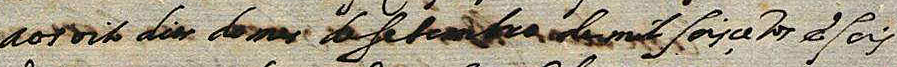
aos oito dias do mes de Setembro de mil seisçētos & seis
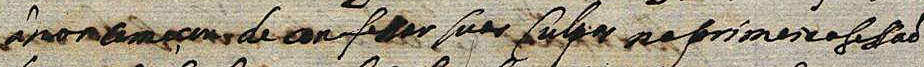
an̄os começou de confessar suas Culpas na primeira sessaõ
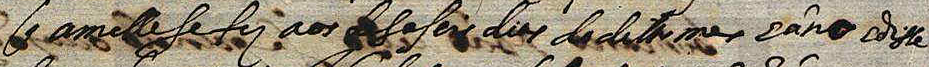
q̄ com elle se fez aos desaseis dias do ditto mes E an̄o E disse
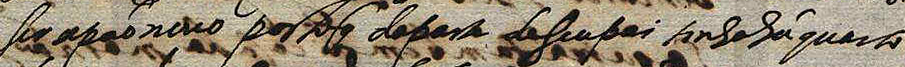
ser xpaõ nouo posto q̄ da parte de Seu pai tinha há quarto
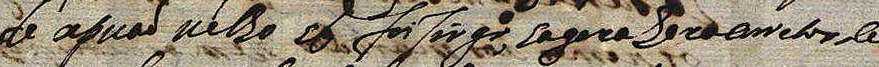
de xpuaõ uelho E q̄ foi Sirgro, E agora hera corretor de
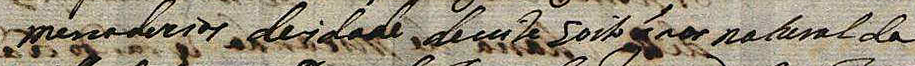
mercadorias de idade de uīte E oito ānos natural da
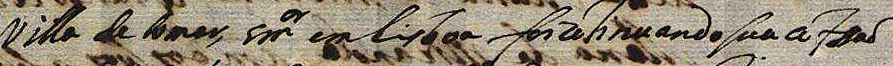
villa de tomar, E mor em Lisboa foi cōtinuando sua cōfssaõ
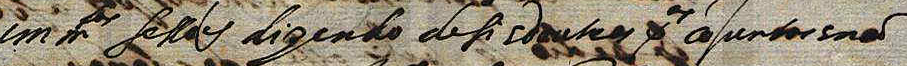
em mtas sessoẽs dizendo de si E doutras pas cōJuntas E naõ
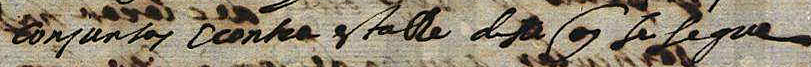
conjuntas E contra esta Re disse o q̄ se segue
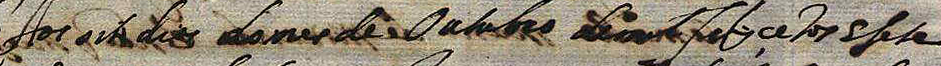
Aos oito dias do mes de Outubro de mil seisçētos E sete
